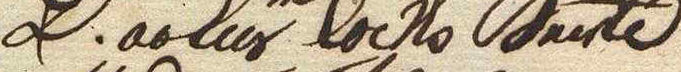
D. ao Escr.m Coelho Duarte
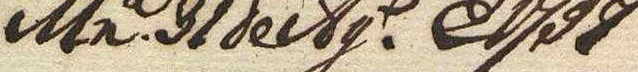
Mn.a 31 de Ag.o E 1797
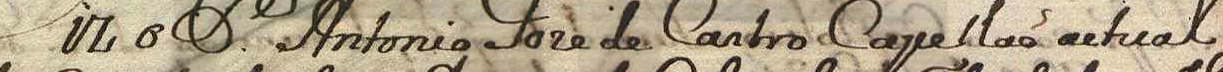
Diz o P.e Antonio Ioze de Castro Capellaõ actual
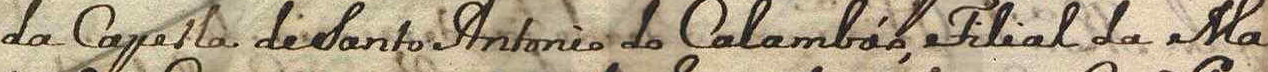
da Capella de Santo Antonio do Calambaõ, e Filial da Ma
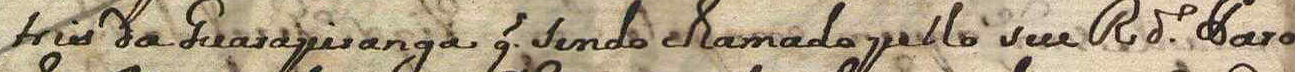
tris da Guarapiranga q̄ sendo chamado pello seu Rd.o Paro
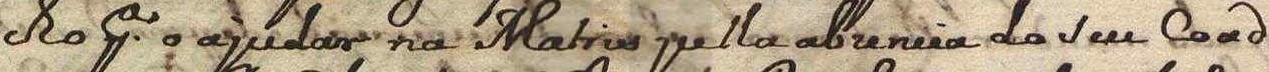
cho p.a o ajudar na Matris pella abzencia do seu Coad
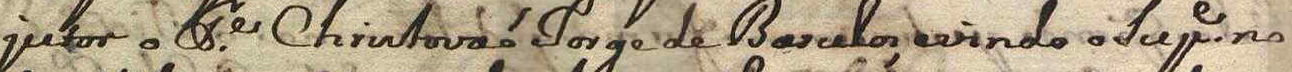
jutor o P.e Christovaõ Iorge de Barcelos, e vindo o Sup.e no
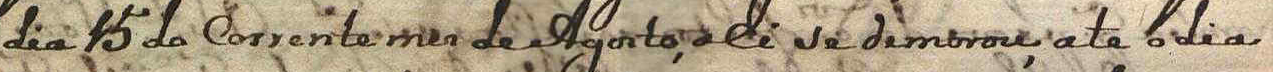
dia 15 do Corrente mes de Agosto, ahi se demorou, ate o dia
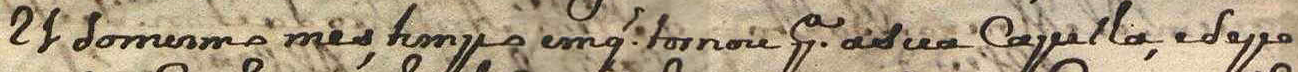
21 do mesmo mes, tempo em q̄ tornou p.a a sua Capella, e depo
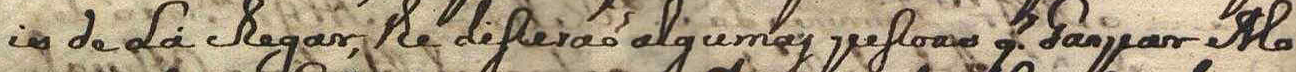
is de Lá chegar, lhe disseraõ algumas pessoas q̄ Gaspar Mo
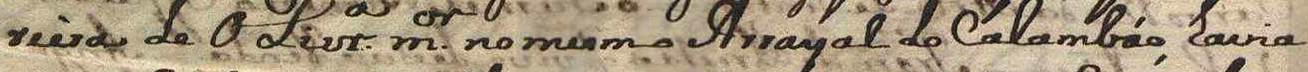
reira de OLivr.a m.or no mesmo Arrayal do Calambáo, havia
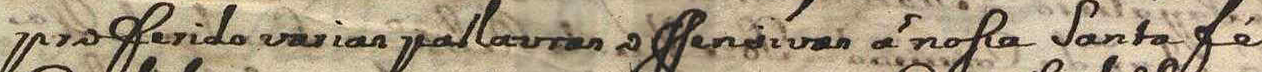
proferido varias pallavras offensivas á nossa Santa fé
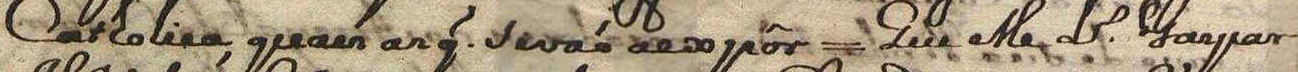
Catholica, quaes as q̄ se vaõ a expôr= Que elle d.o Gaspar
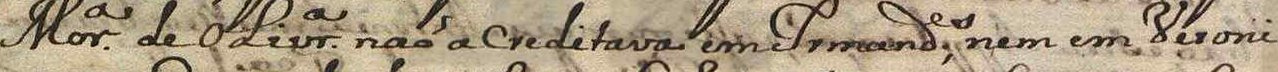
Mor.a de OLivr.a naõ acreditava em Irmand.es, nem em Veroni
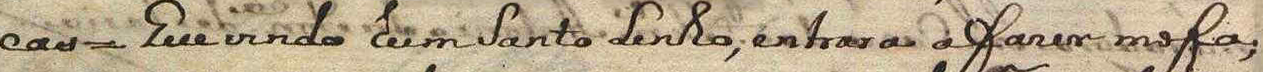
cas= Que vendo hum Santo Lenho, entrara a fazer mofa;
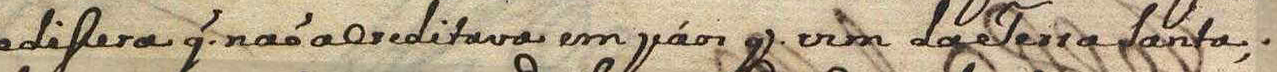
e disera q̄ naõ acreditava em páos q̄ vem da Terra Santa;
